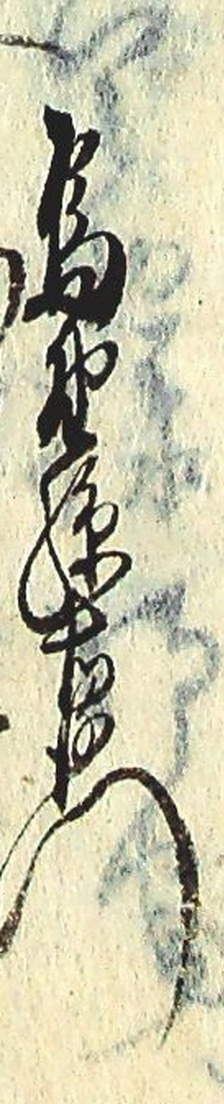鷹野孫右衛門
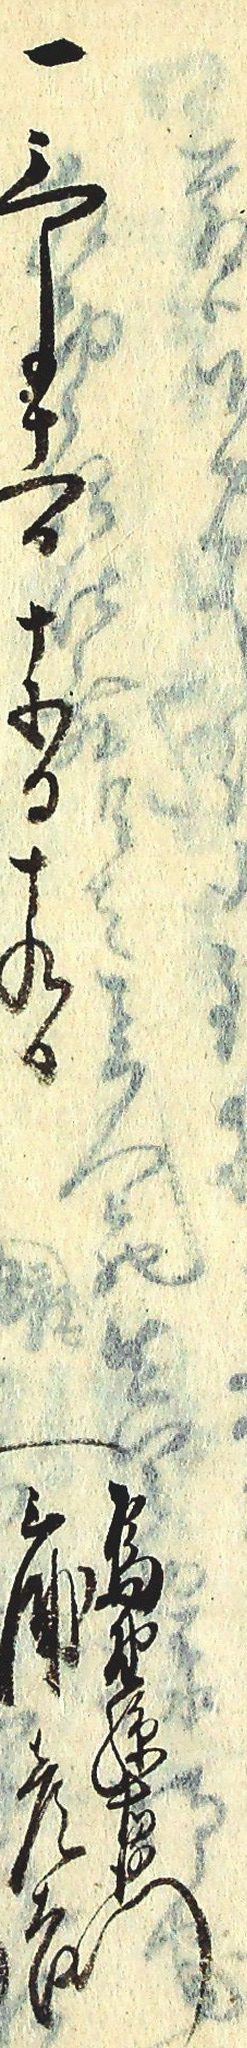一三月十一日十五日十九日三浦彦吉
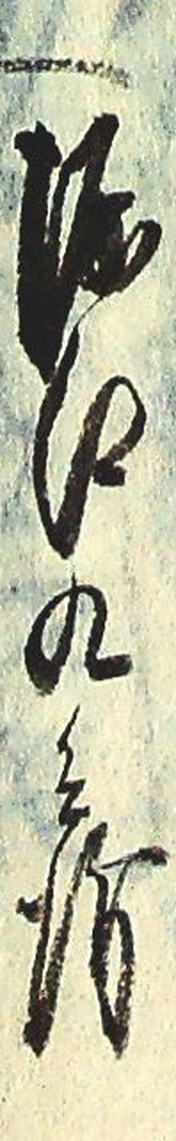堀江九兵衛
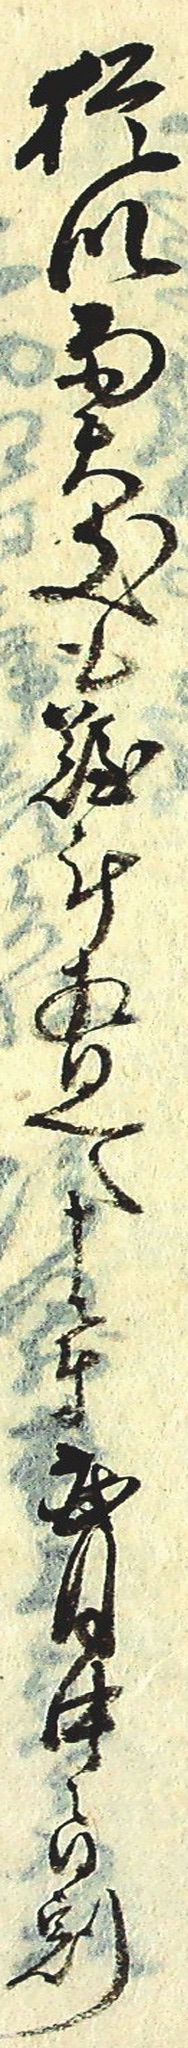猶以雨天支も難計相見へ申に付当月中之日割
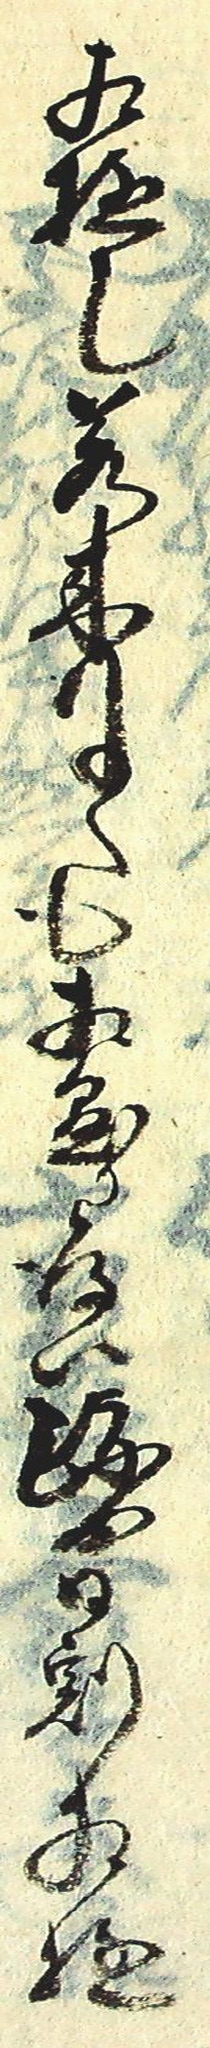相極申候若来月へも相懸り候得は跡ゟ日割相極
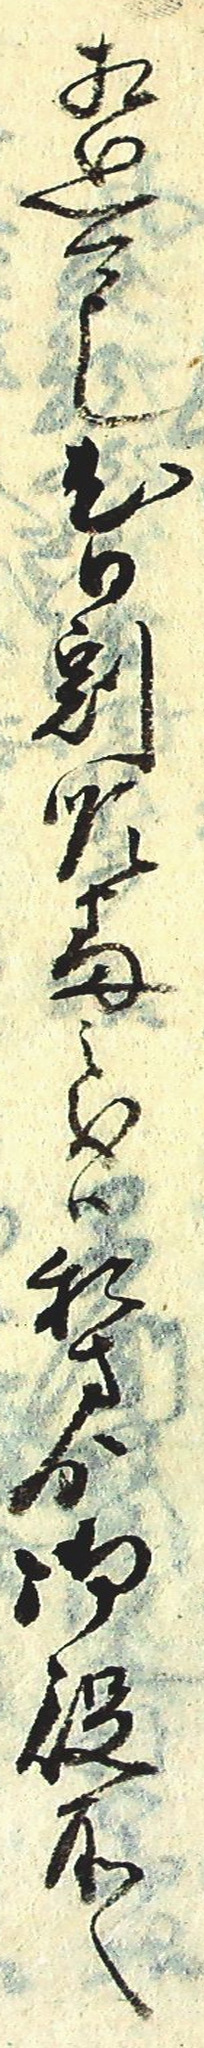相廻可申候尤日割順番之義は私方ゟ御役所へ
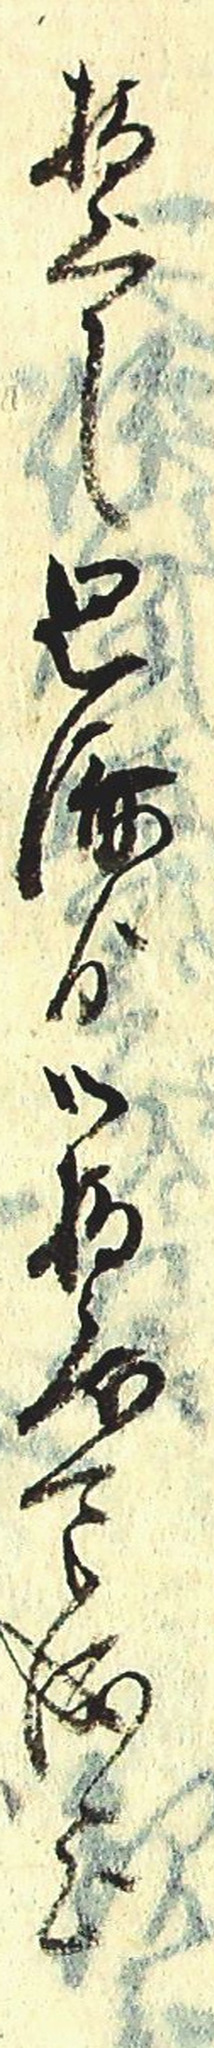指上申候廻済ゟ御指戻可被成候以上

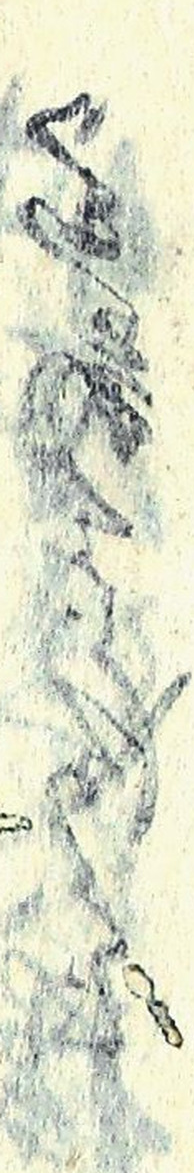三月十四日
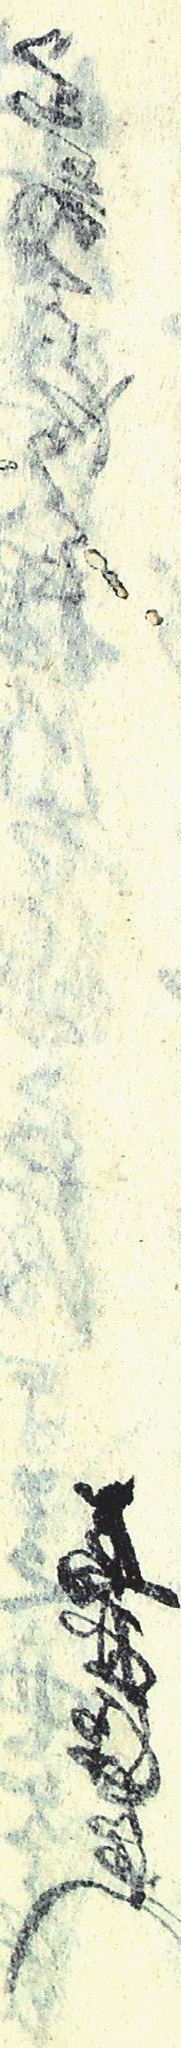三月十四日
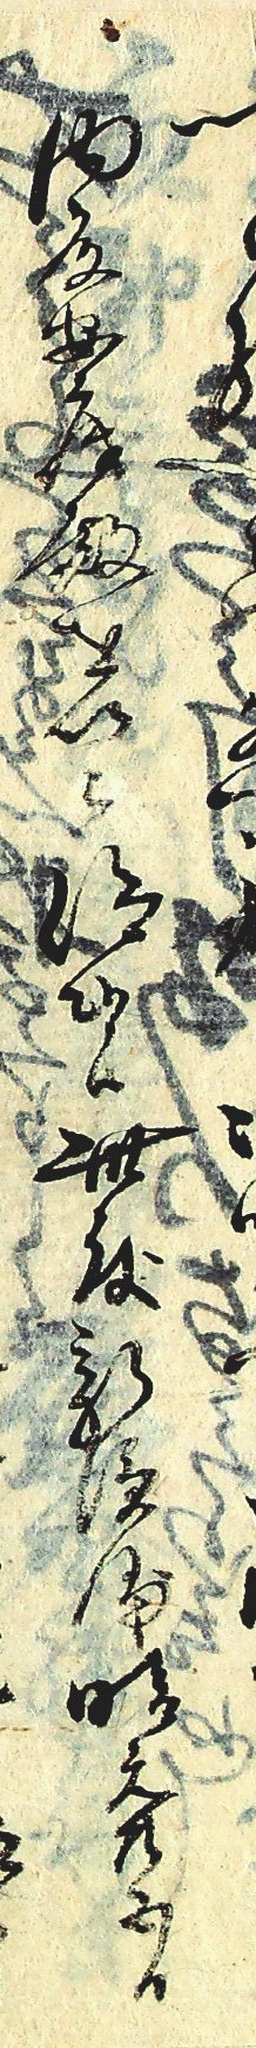内藤安兵衛殿を以被仰出候此度新浜浦晴天廿五日
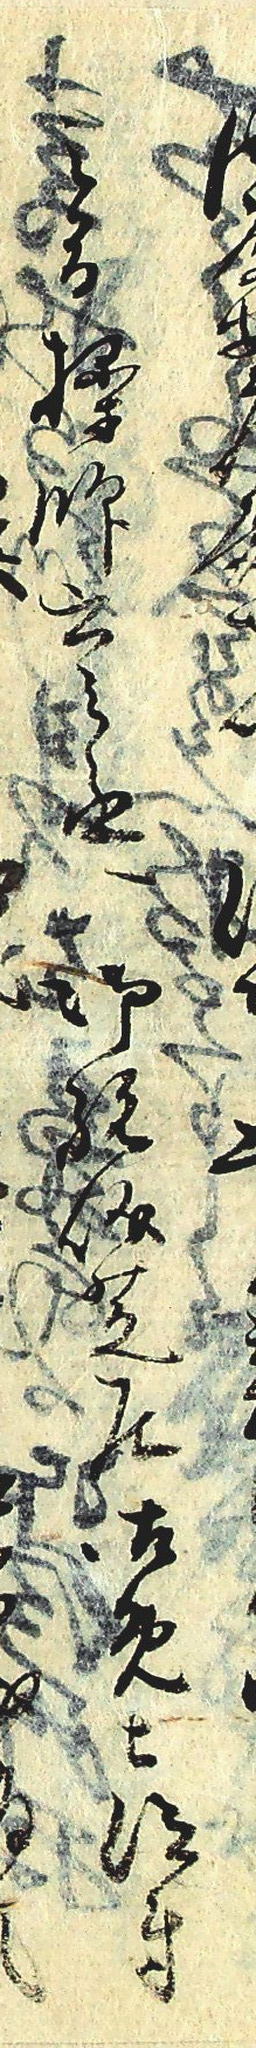之間操師六之丞へ御祝儀芝居御免被仰付
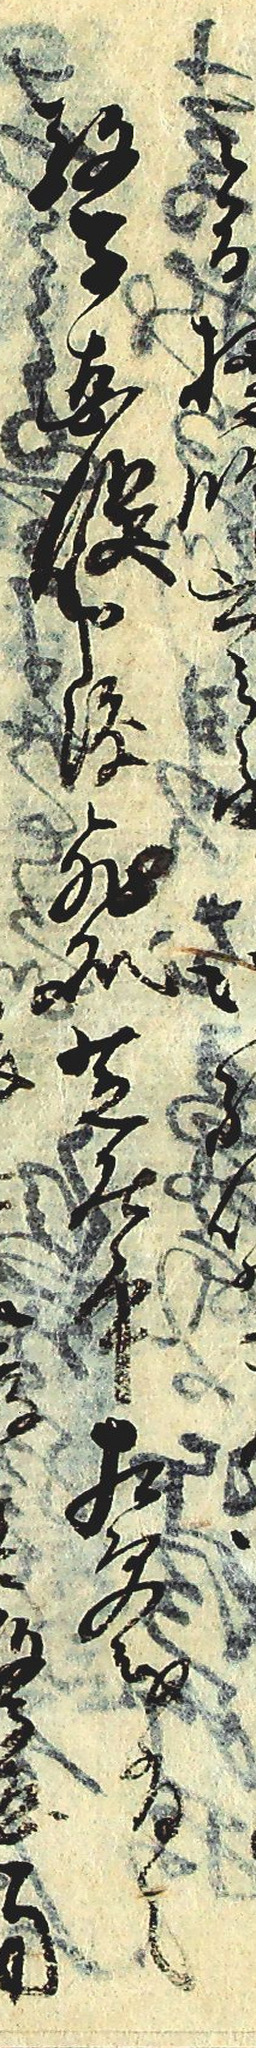警固役申渡候然処芝居中相受義有之
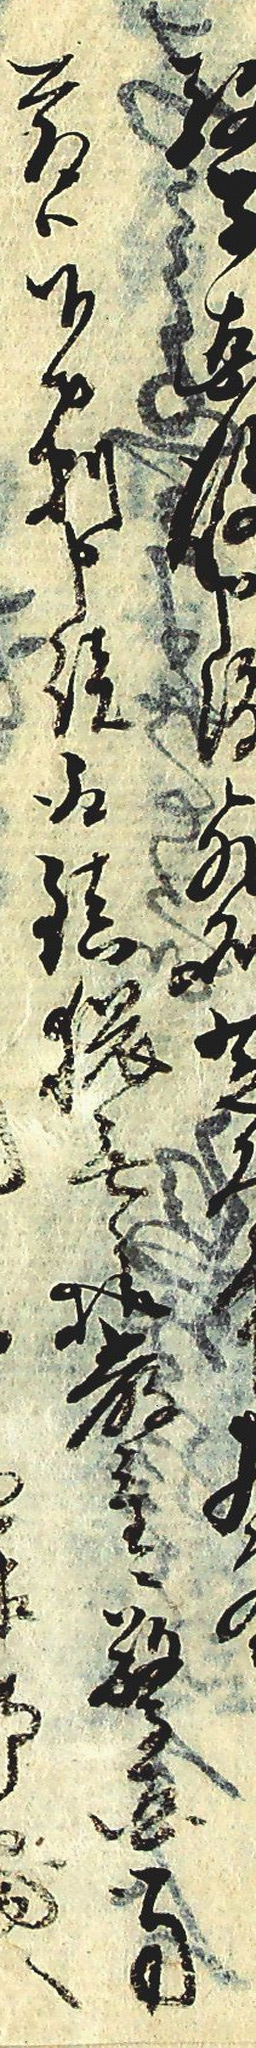節は下才判申談取鎮猥無之様厳重に警固御用
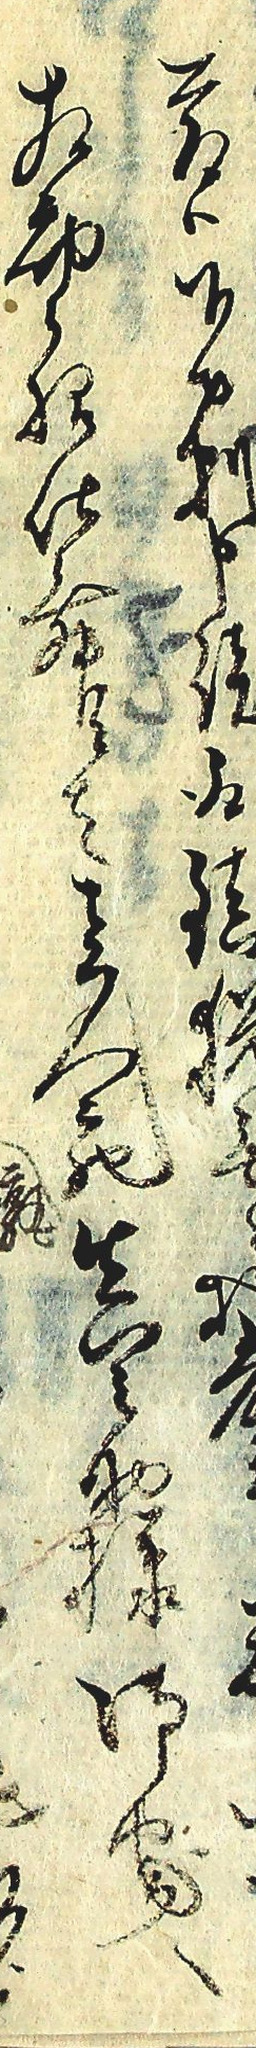相勤候様仕舞には壱人宛真之助様御宅へ
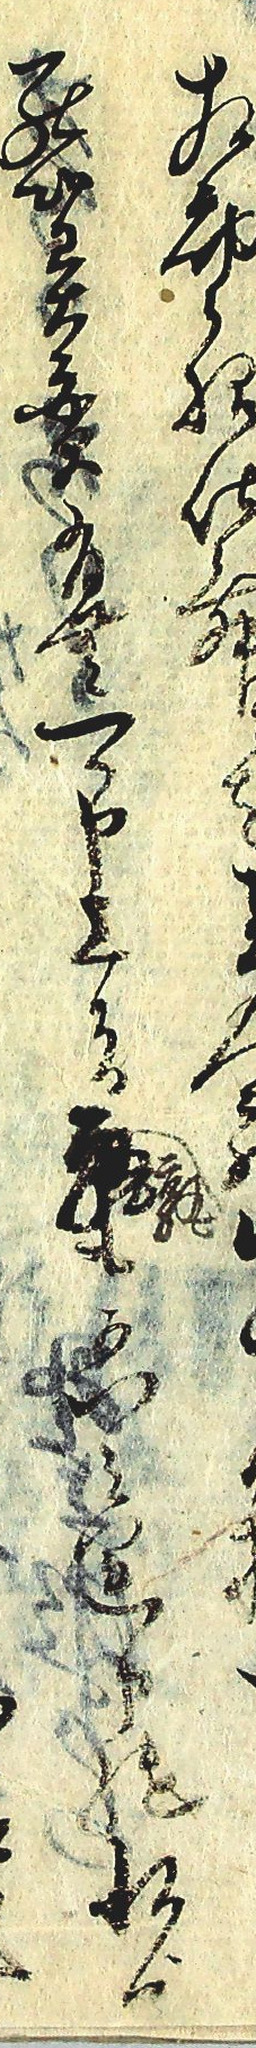罷出異変有無可申上旨孰も右之運申継私ゟ
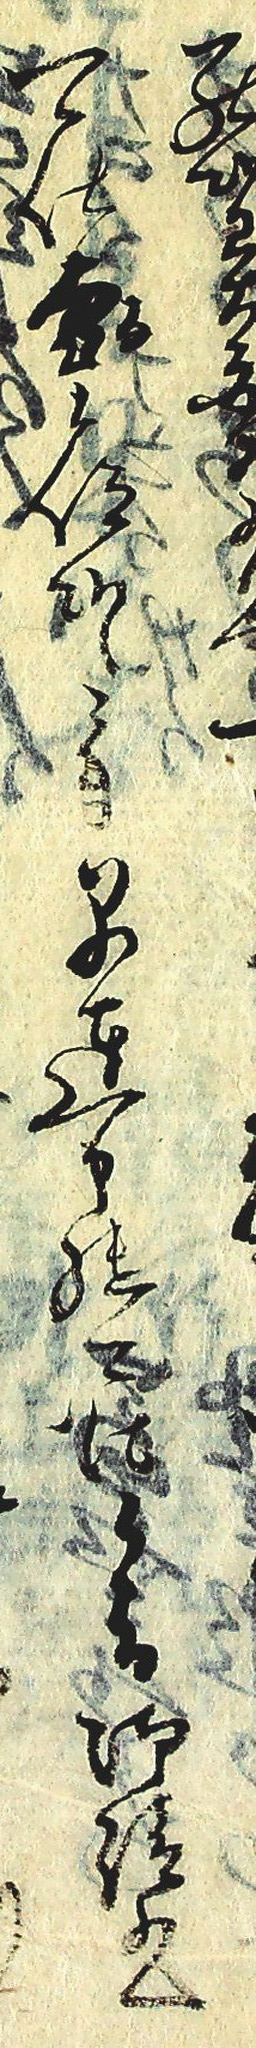可仕被仰出候に付早速申継可仕候旨御請書
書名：諸御願書控(弐番）
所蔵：鳴門教育大学 Naruto University of Education
